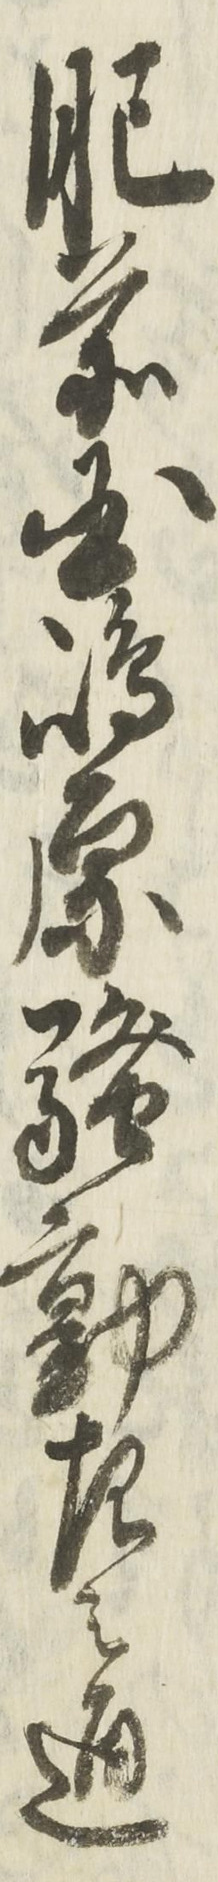肥前国嶋原騒動左之通
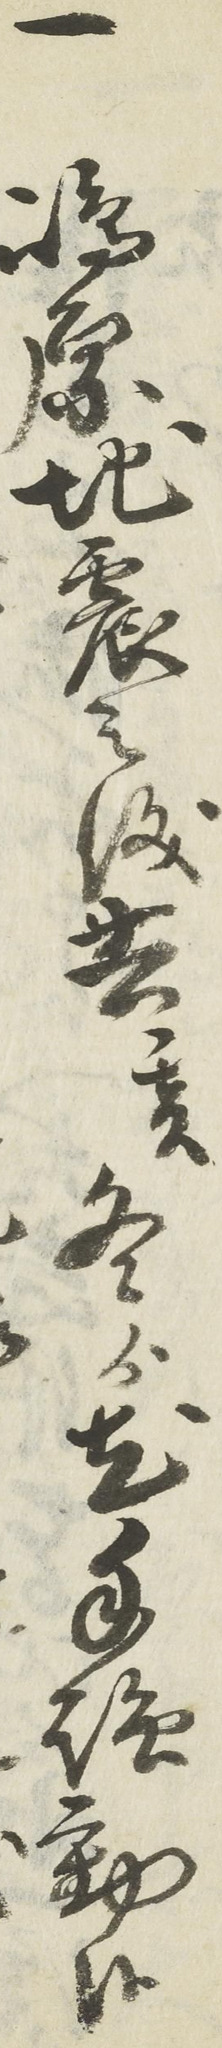一嶋原地震之儀去亥冬ゟ尤手強動候
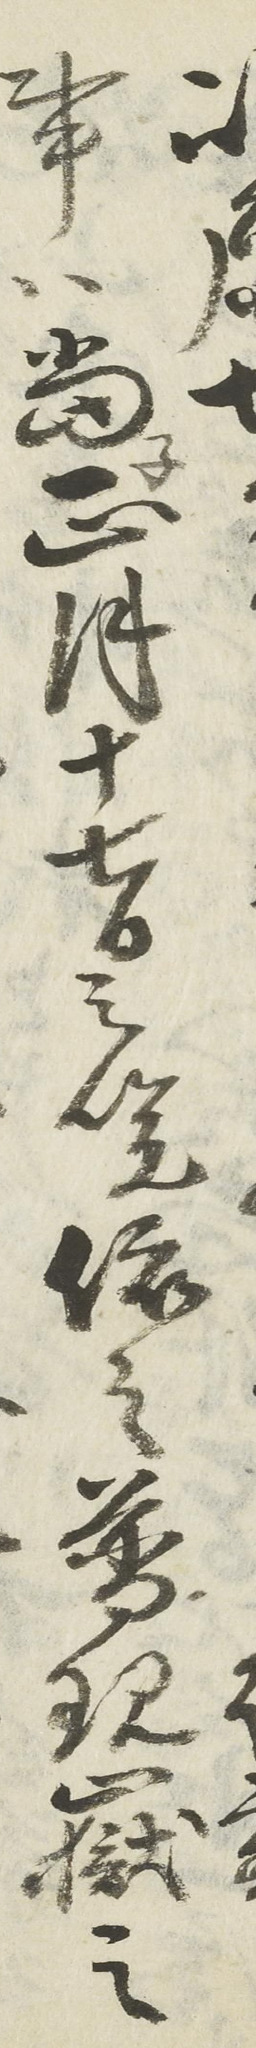事は当子正月十七日之晩依之普現嶽の
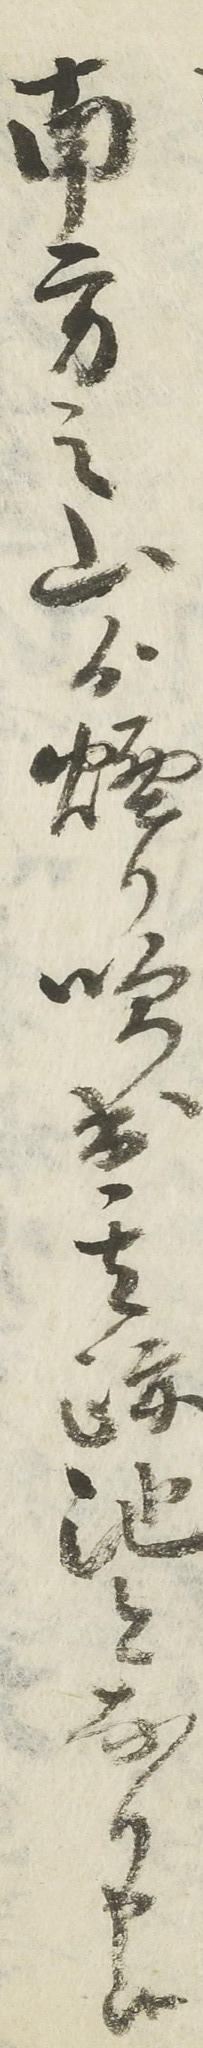南方之山ゟ煙り吹出其跡池となり申候
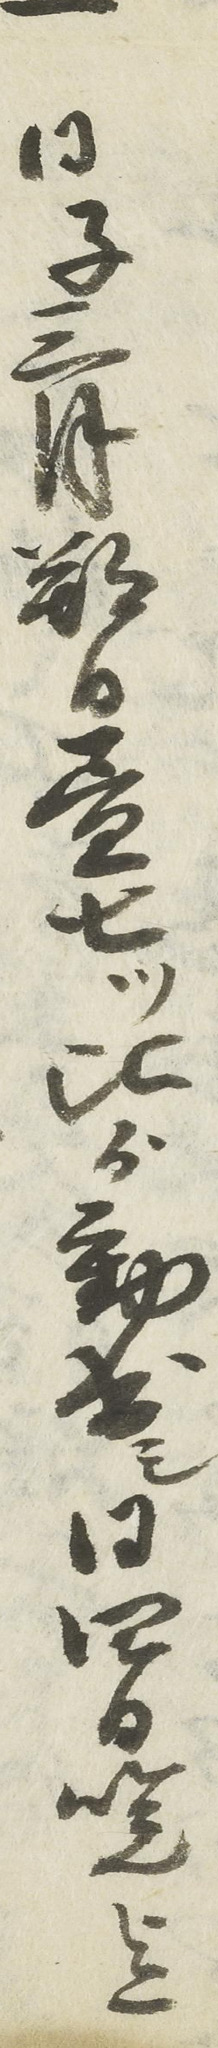一同子三月朔日昼七ツ比ゟ動出シ同四日晩迄
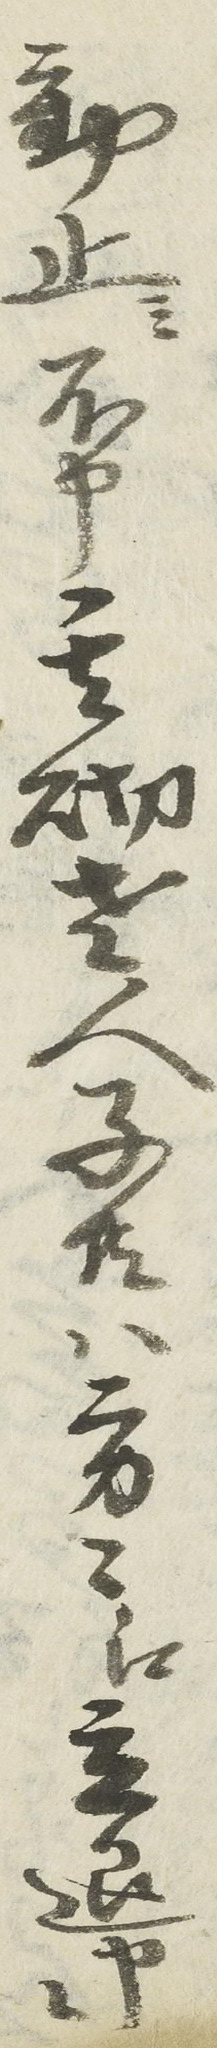動止み不申其砌老人子共は方々江立退申候
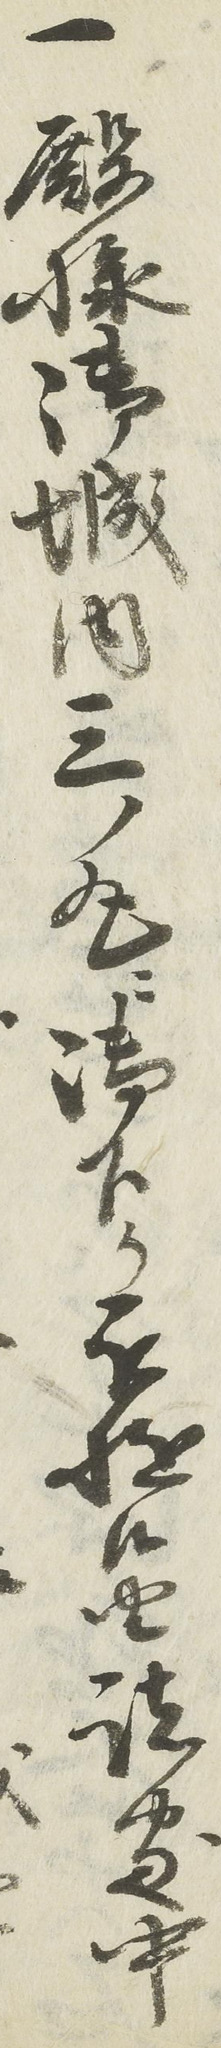一殿様御城内三ノ丸ニ御下り被遊候由諸家中
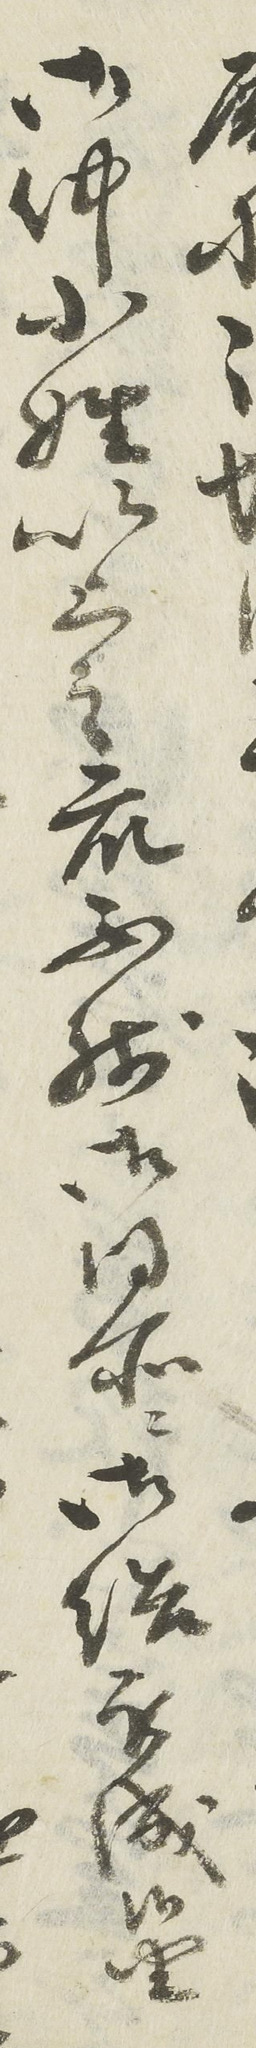御仲小姓以上之衆不残御同所ニ御詰被成候由
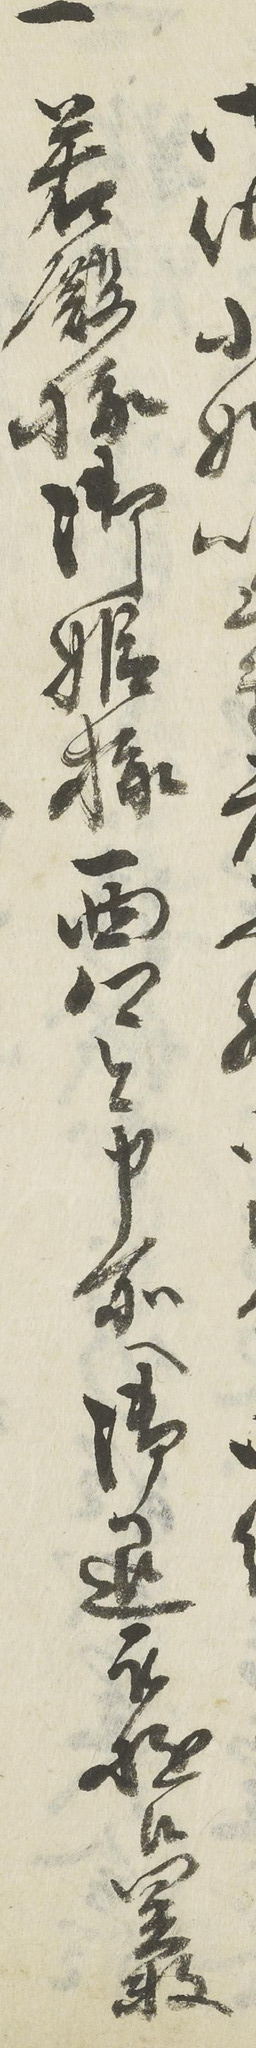一若殿様御姫様西郷と申所へ御退被遊候里数
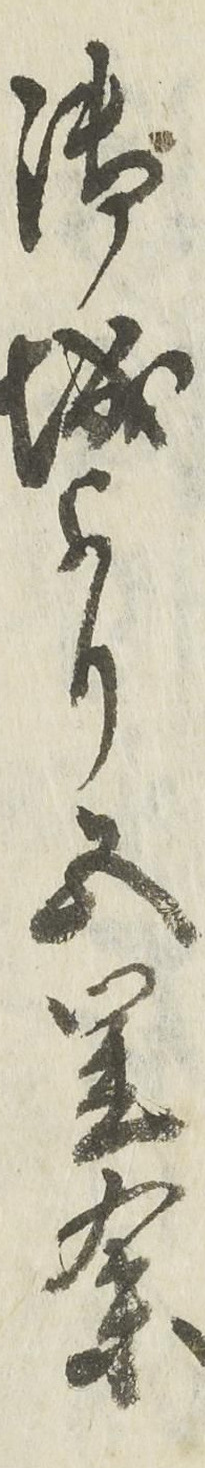御城より五里余
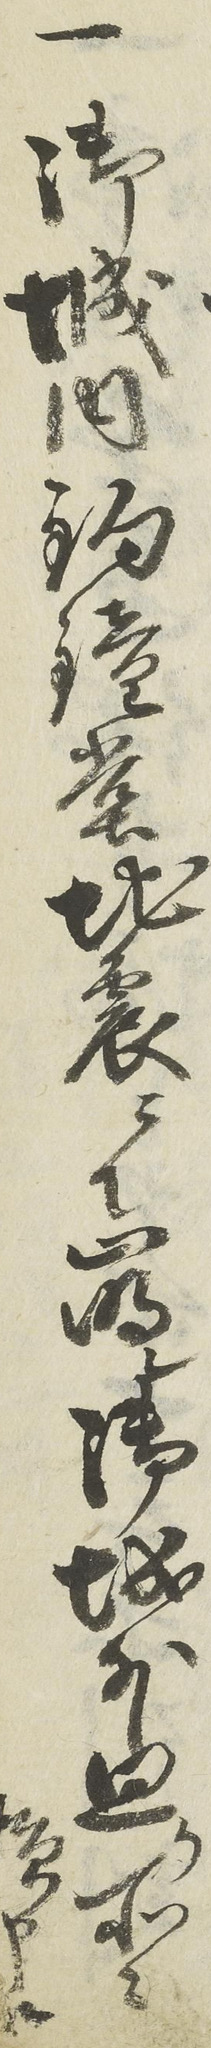一御城内釣鐘堂地震ニて崩レ御城外廻り所々損申候

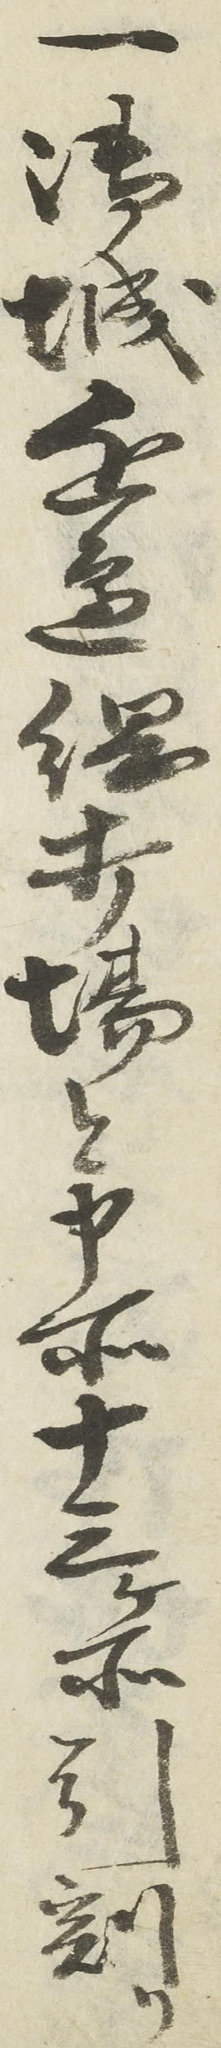一御城近辺綱打場と申所十三ケ所引割り
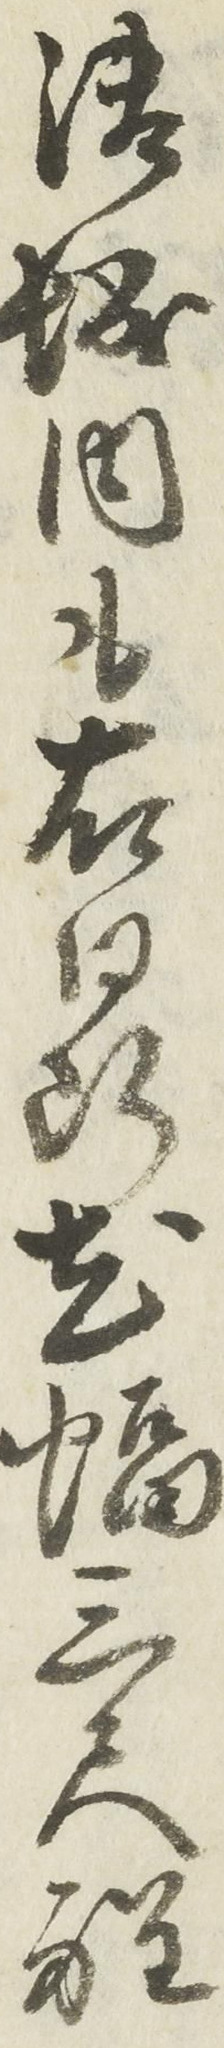御城内も右同断尤幅三尺程
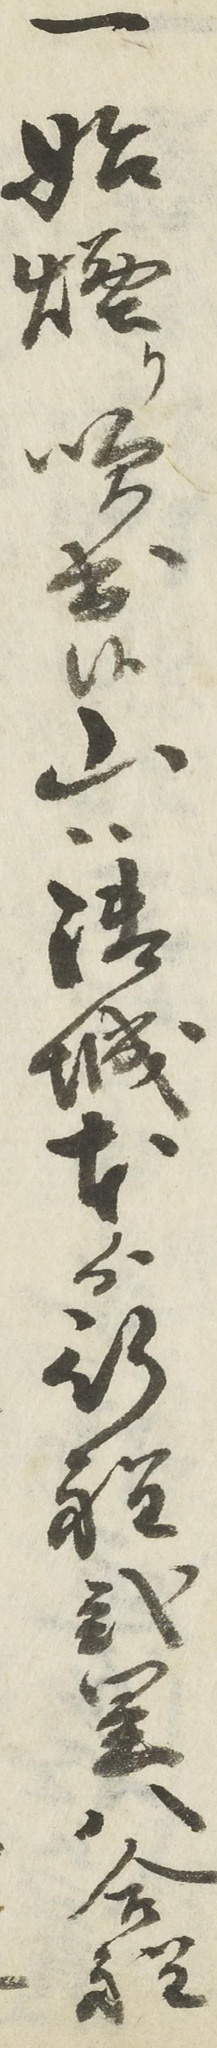一始煙り吹出候山は御城本ゟ行程弐里八合程
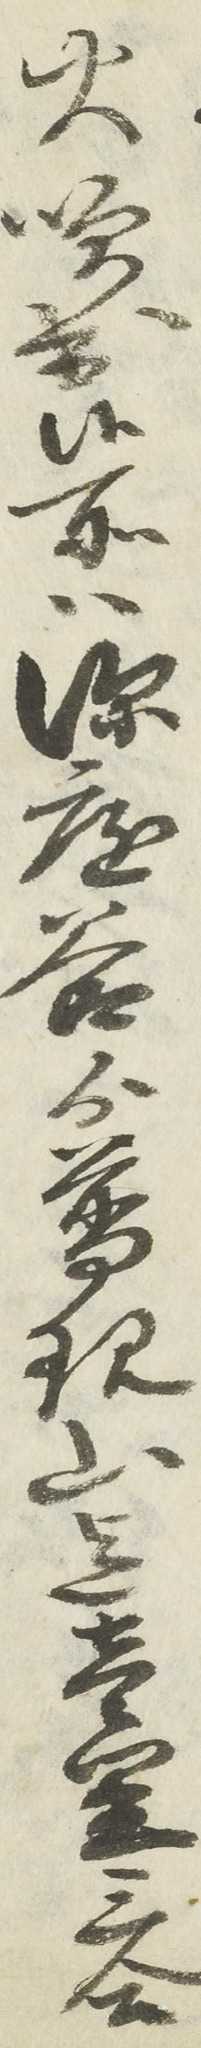火吹出候所は深庭谷ゟ普現山迄壱里三合
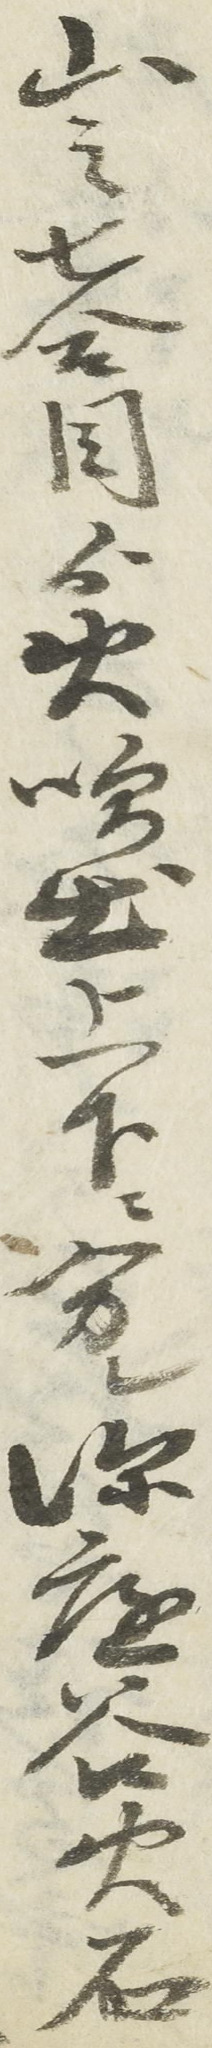山之七合目ゟ火吹出上下ニ分レ深庭谷火石
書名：後見笑
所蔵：東京大学地震研究所図書室 Earthquake Research Institute Library, The University of Tokyo, JAPAN
